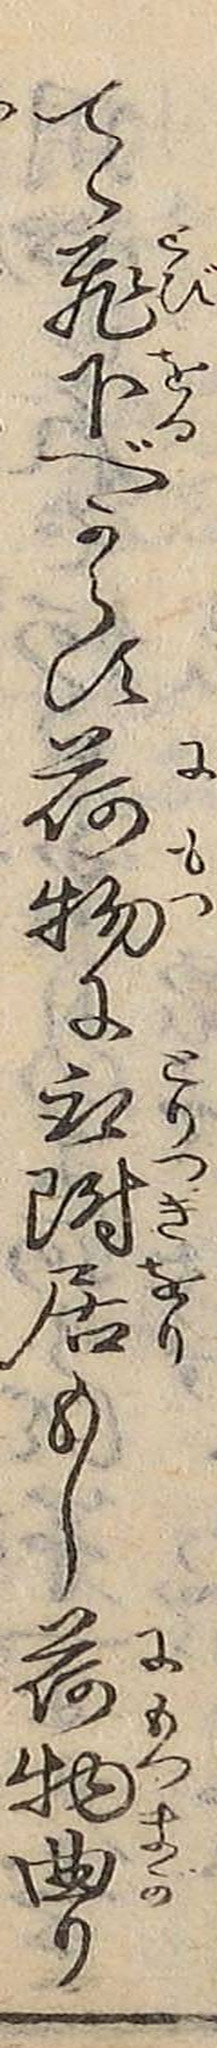てゝ飛下べからす荷物に取附居もし荷物曲り
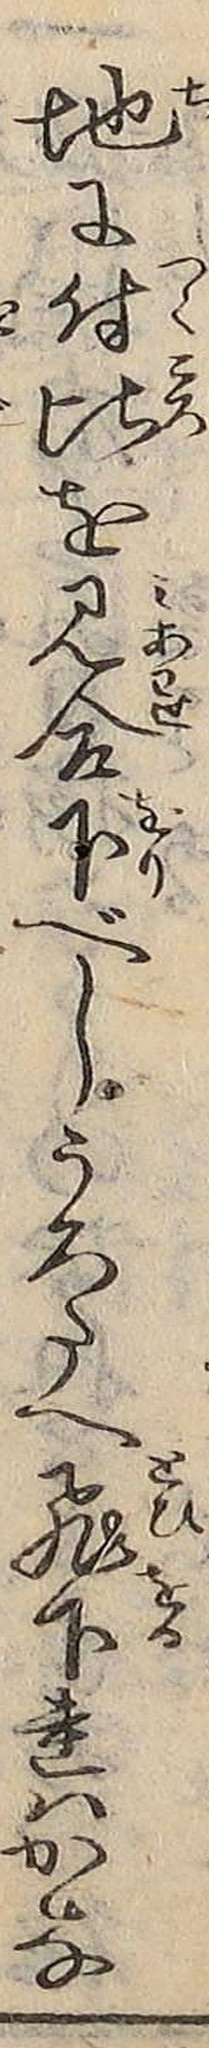地に付比を見合下べしうろたへ飛下れはかな
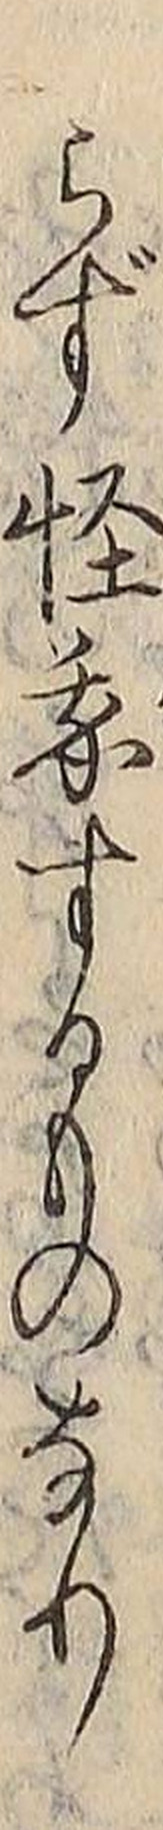らず怪我するものなり
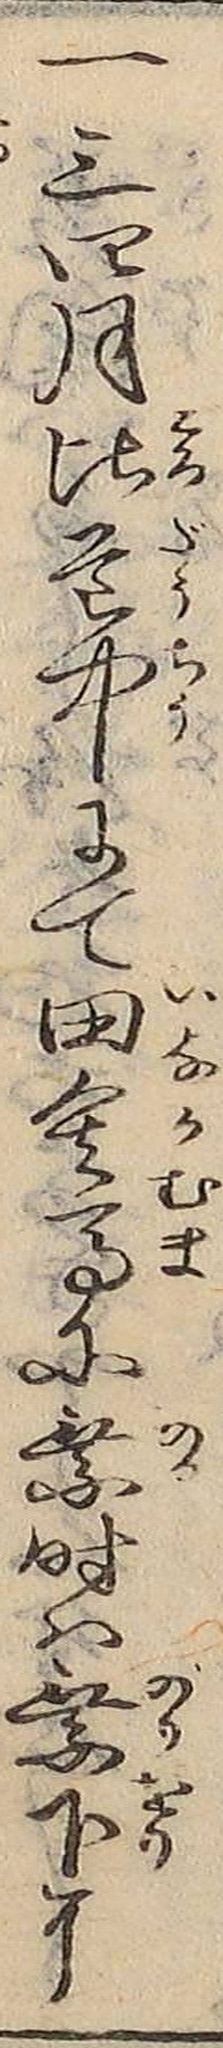一三四月比道中にて田舎馬に乗時は乗下に
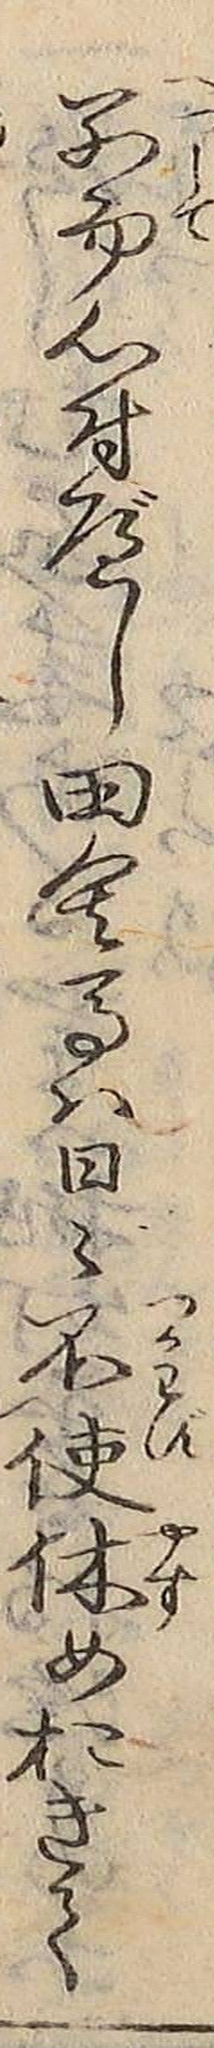別而心付べし田舎馬は日々不使休めおきて
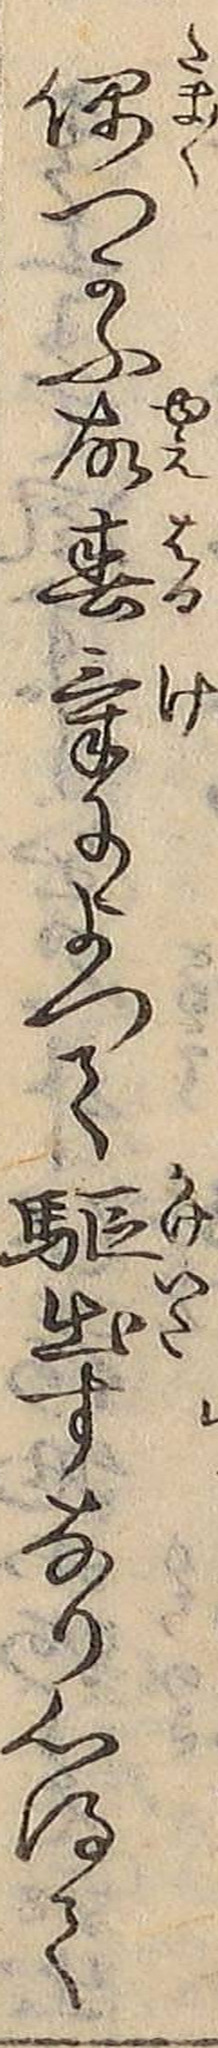偶つかふ故春気によつて駆出すなり心得て
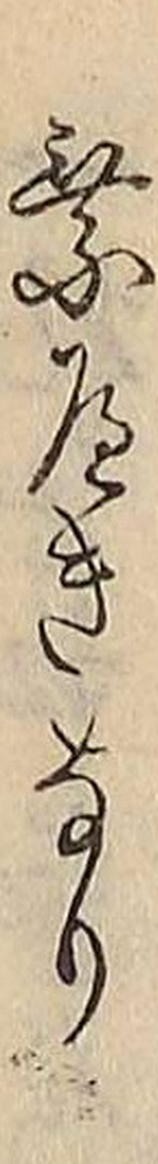乗へきなり
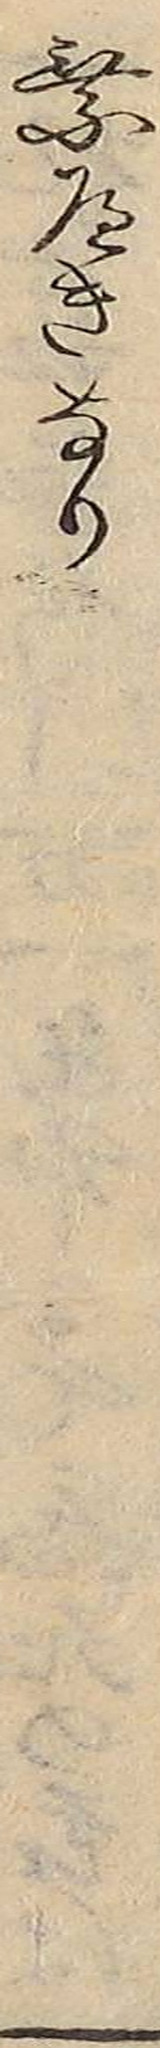乗へきなり
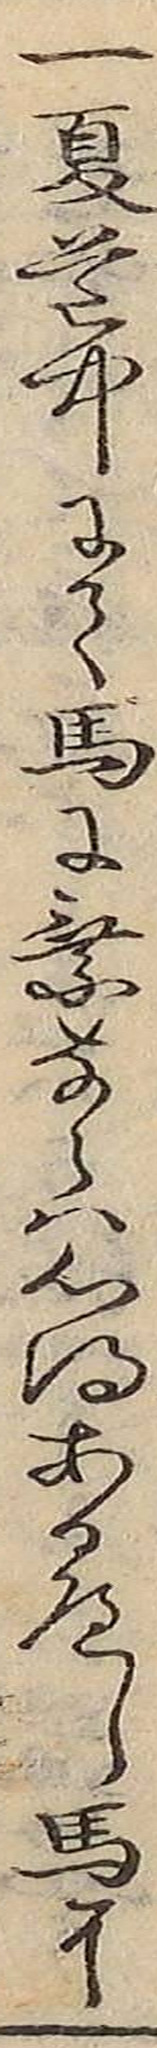一夏道中にて馬に乗ならは心得あるへし馬に
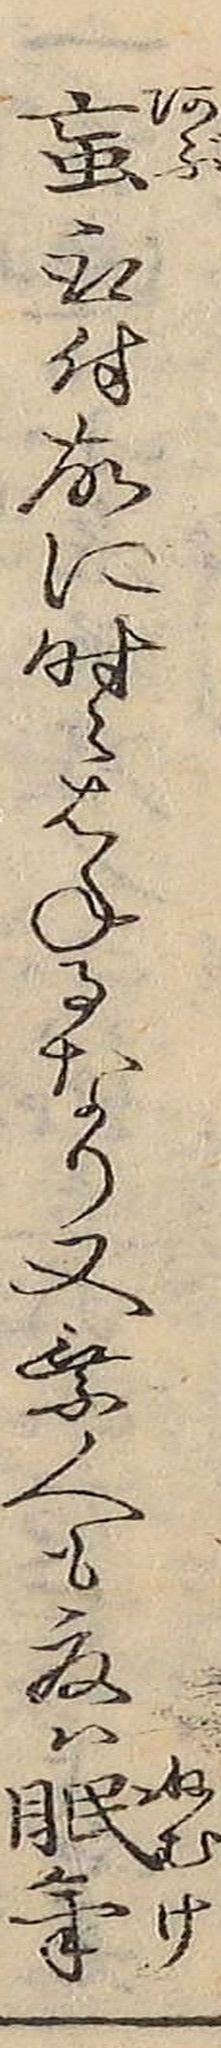虻取付故に時々はねるなり又乗人も夏は眠気
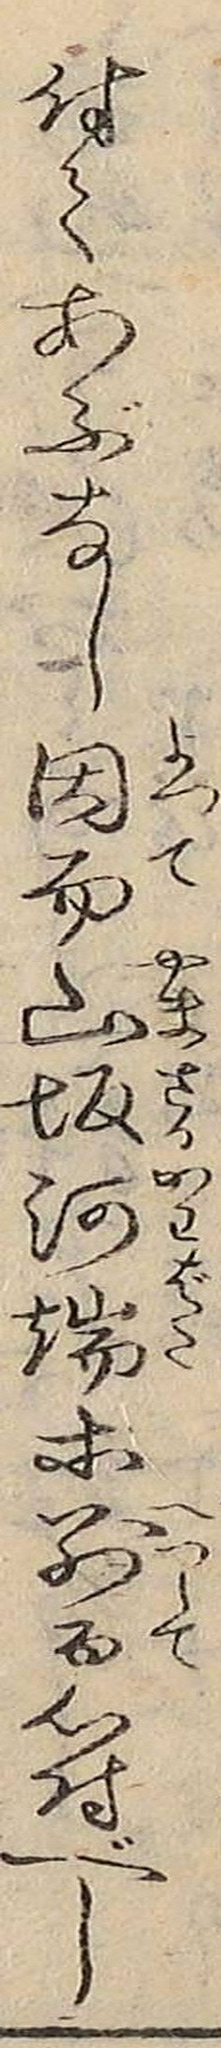付てあぶなし因而山坂河端等別而心付べし
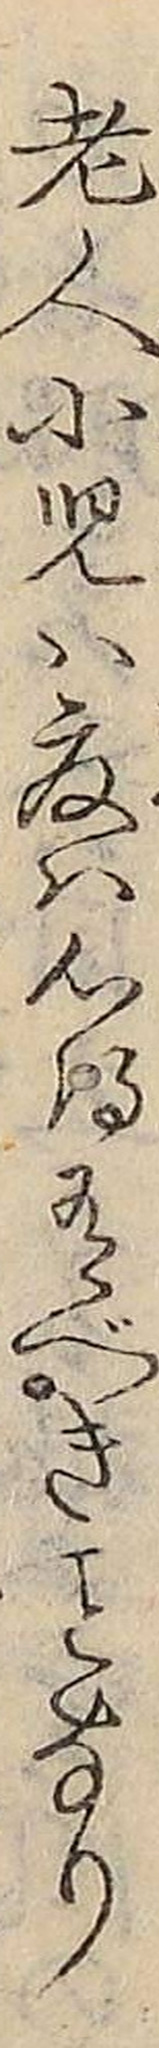老人小児は夏は心得有べきことなり
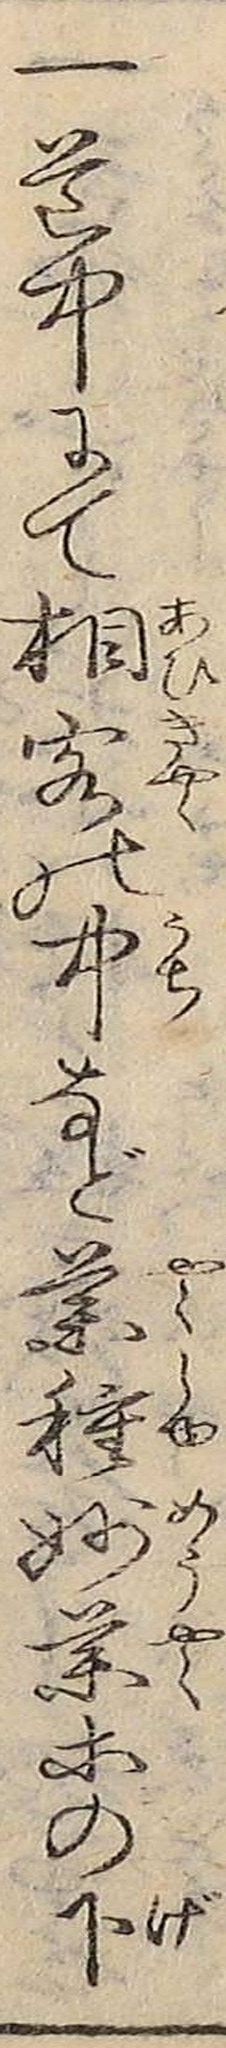一道中にて相客の中など薬種妙薬等の下
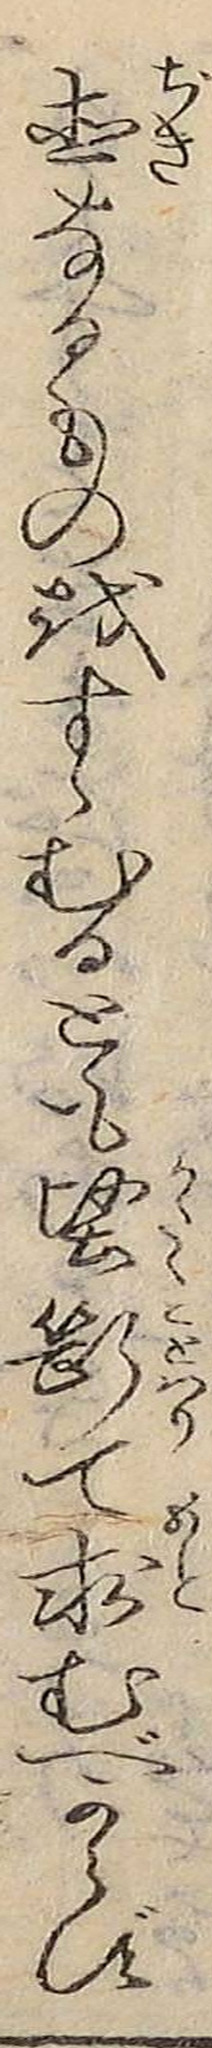直なるものをすゝむるとも堅断て求むべからず
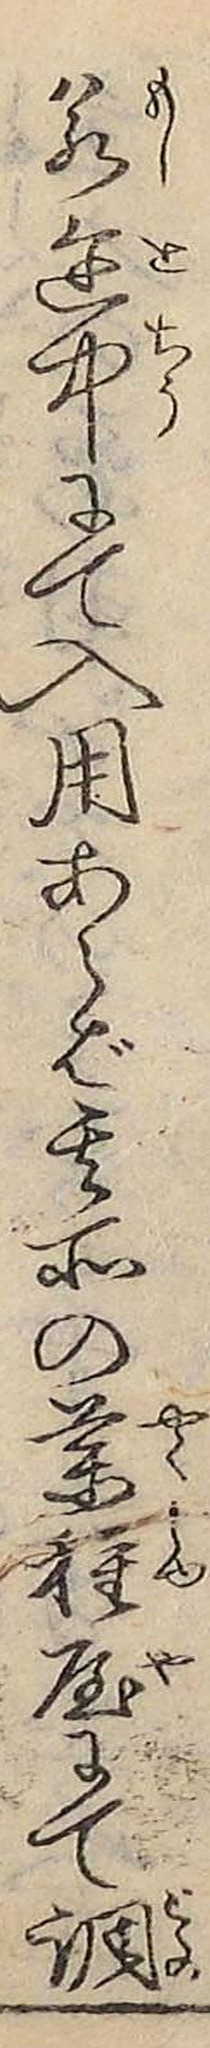若途中にて入用あらば其所の薬種屋にて調
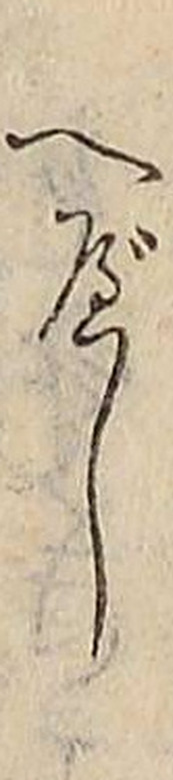へべし
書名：旅行用心集
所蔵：神戸大学附属図書館 国文学研究資料館
